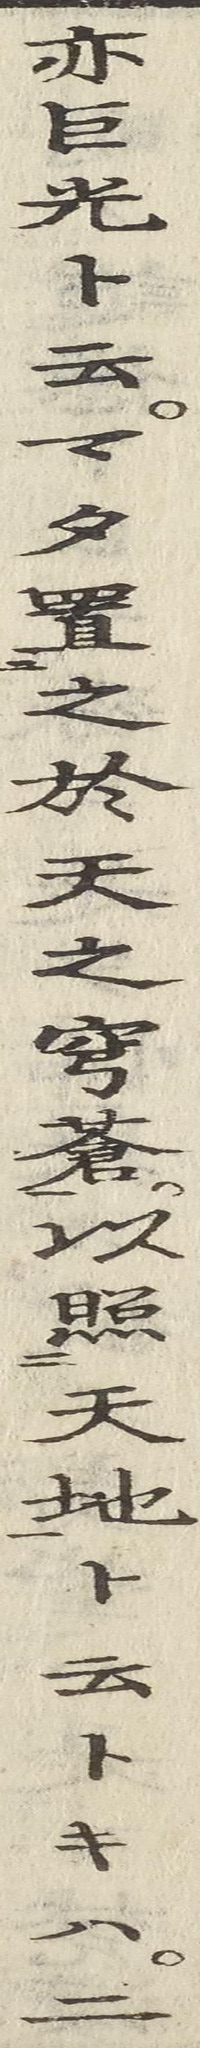亦巨光ト云。マタ置ニ之於天之穹蒼。以照ニ天地ト云トキハ。ニ
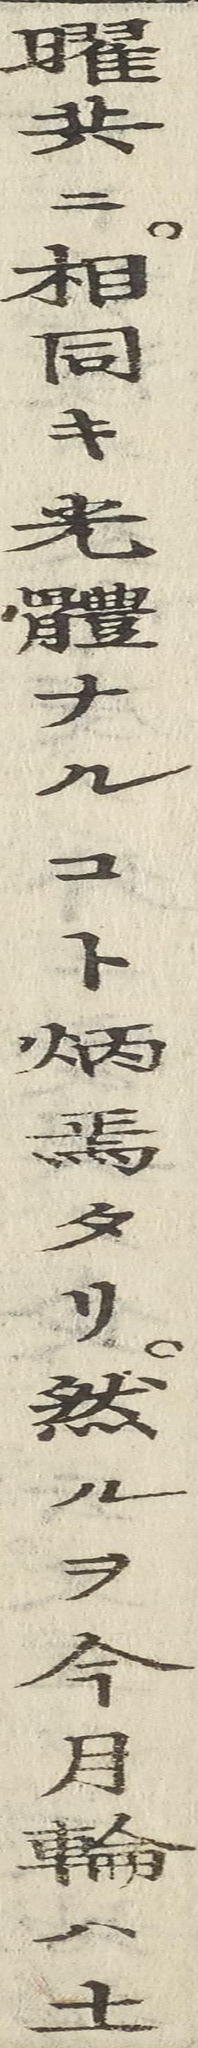曜共ニ。相同キ光体ナルコト炳焉タリ。然ルヲ今月輪ハ土
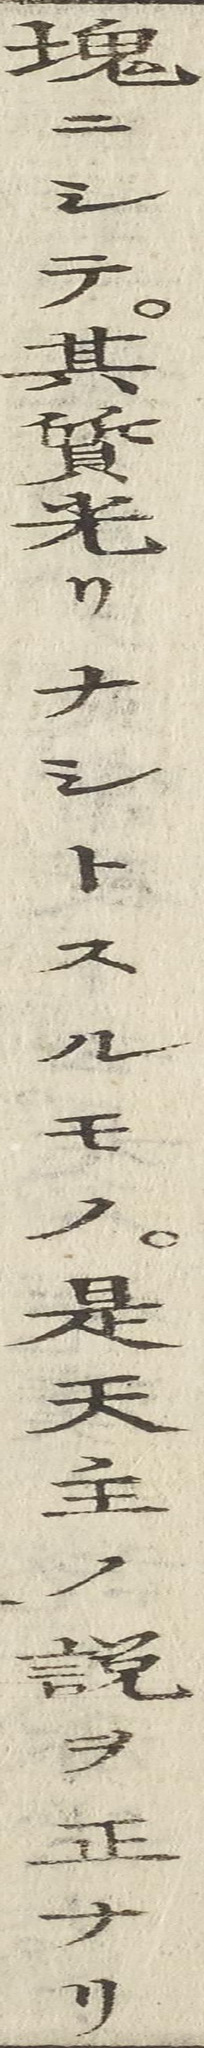塊ニシテ。其質光リナシトスルモノ。是天主ノ説ヲ正ナリ
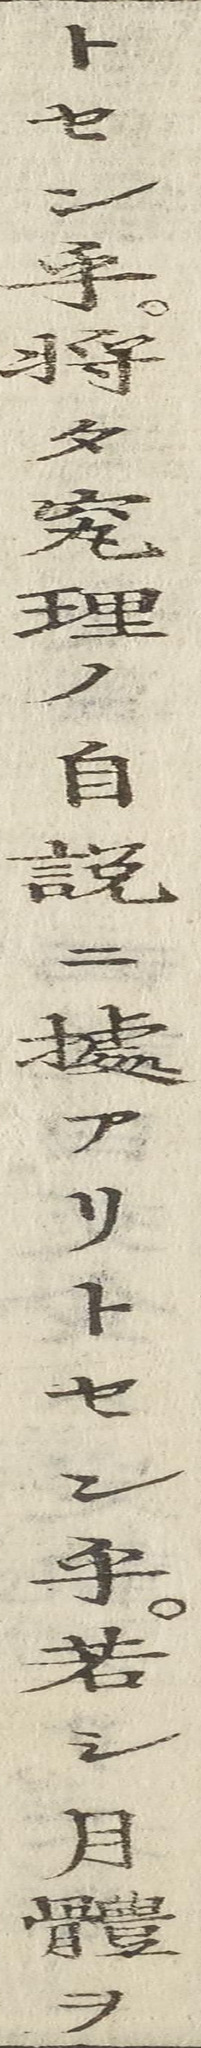トセン乎。将タ究理ノ自説ニ拠アリトセン乎。若シ月体ヲ
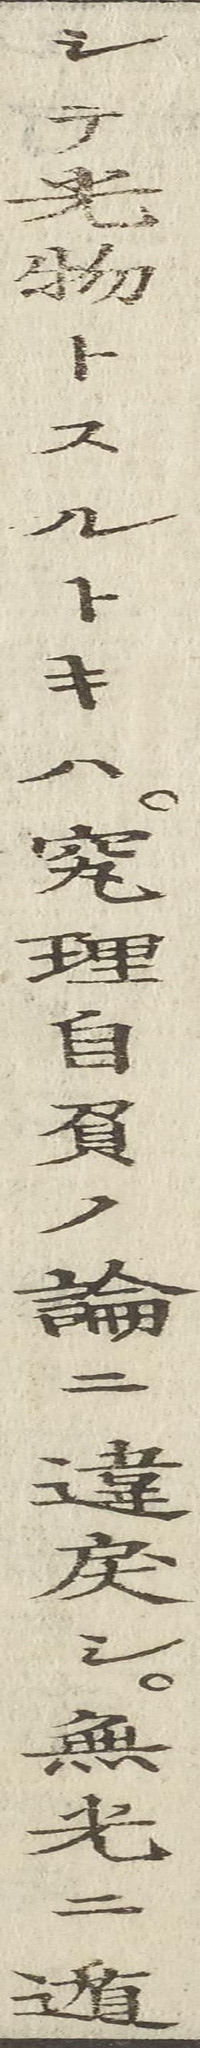シテ光物トスルトキハ。究理自負ノ論ニ違戻シ。無光ニ遁
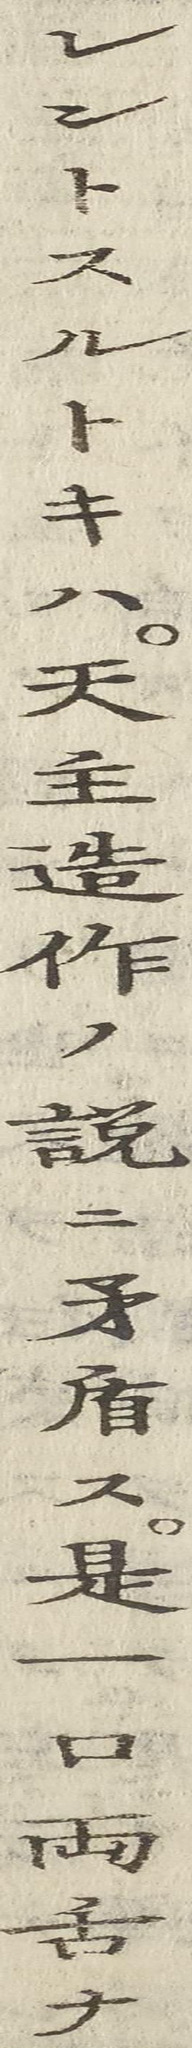レントスルトキハ。天主造作ノ説ニ矛盾ス。是一口両舌ナ

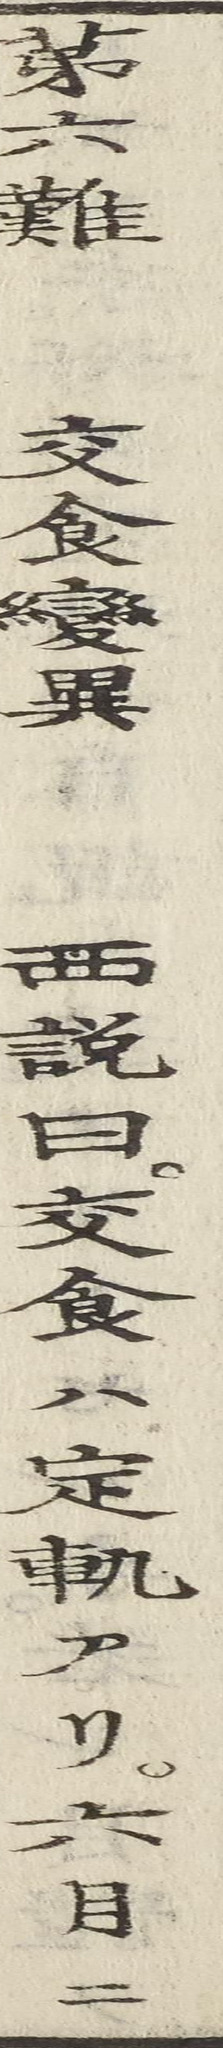第六難交食変異西説曰。交食ハ定軌アリ。六月ニ
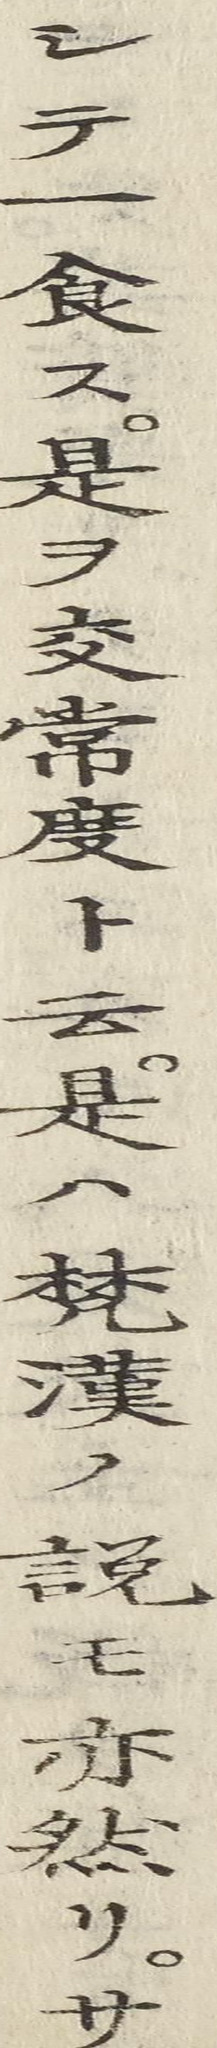シテ一食ス。是ヲ交常度ト云。是ハ梵漢ノ説モ亦然リ。サ
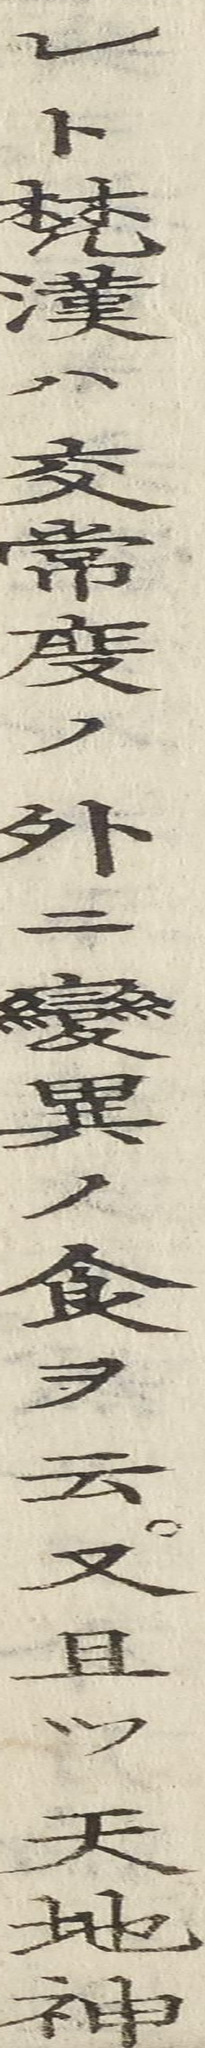レト梵漢ハ交常度ノ外ニ変異ノ食ヲ云。又且ツ天地神
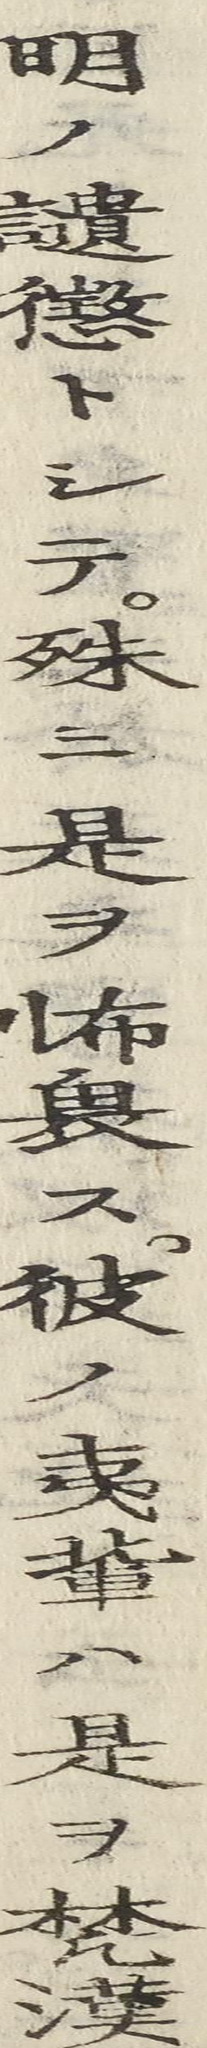明ノ譴懲トシテ。殊ニ是ヲ怖畏ス。彼ノ夷輩ハ是ヲ梵漢
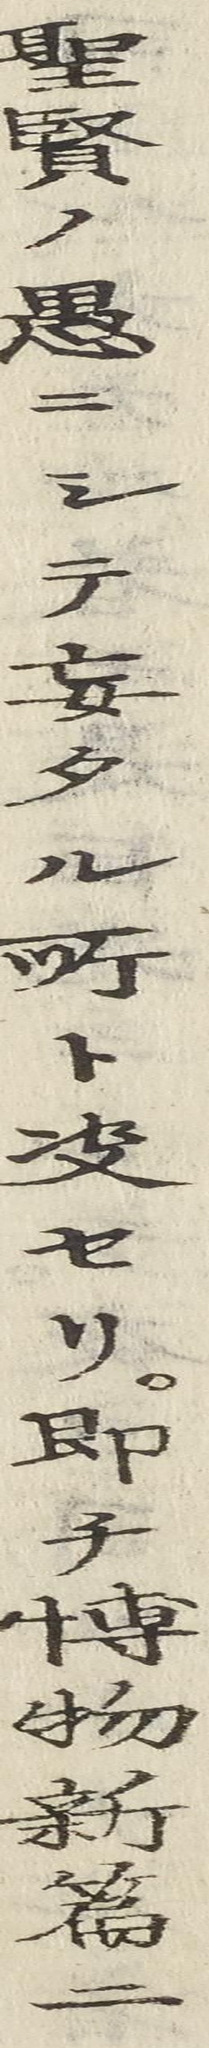聖賢ノ愚ニシテ妄タル所ト決セリ。即チ博物新篇ニ十四
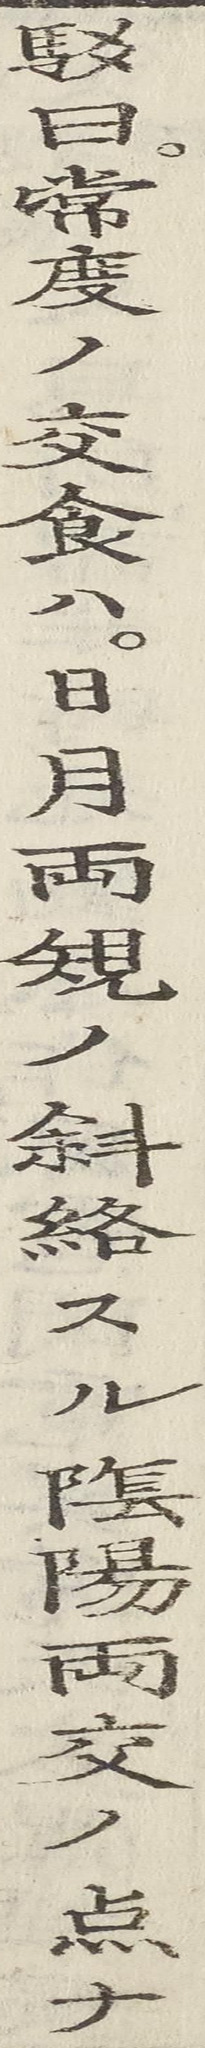駁曰。常度ノ交食ハ。日月両規ノ斜絡スル陰陽両交ノ点ナ
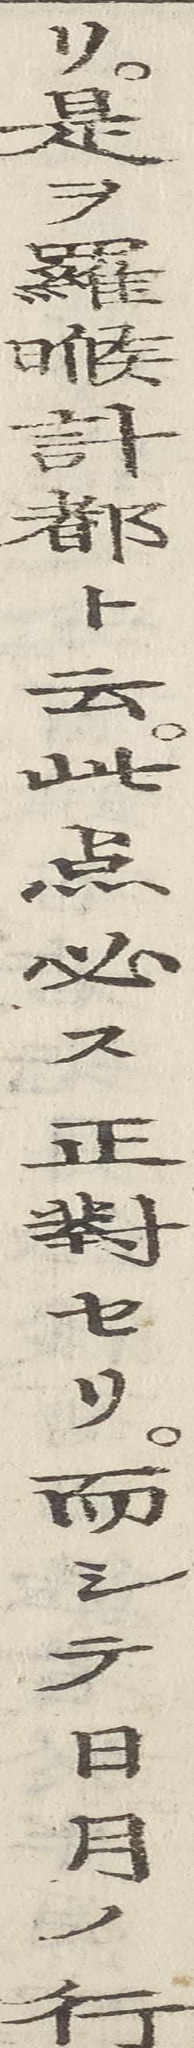リ。是ヲ羅睺計都ト云。此点必ス正対セリ。而シテ日月ノ行。
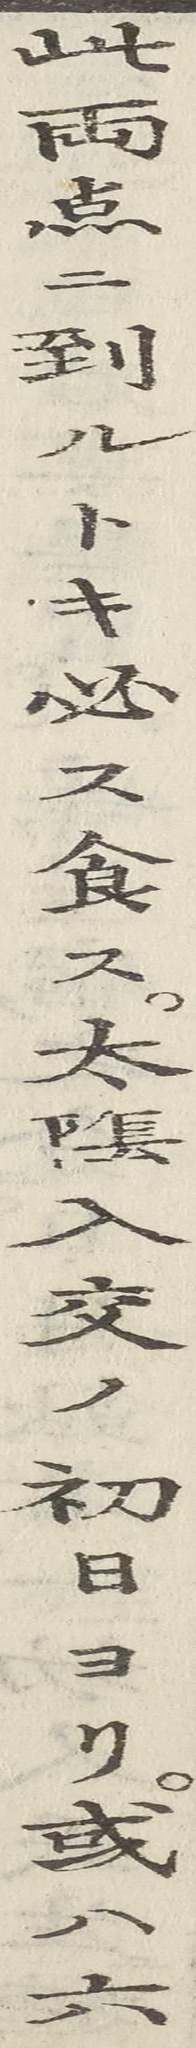此両点ニ到ルトキ必ス食ス。太陰入交ノ初日ヨリ。或ハ六
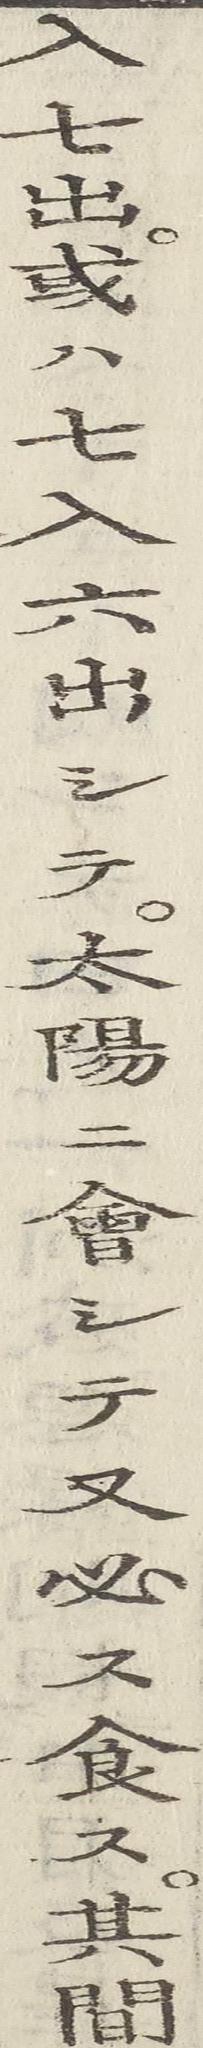入七出。或ハ七入六出シテ。太陽ニ会シテ又必ス食ス。其間
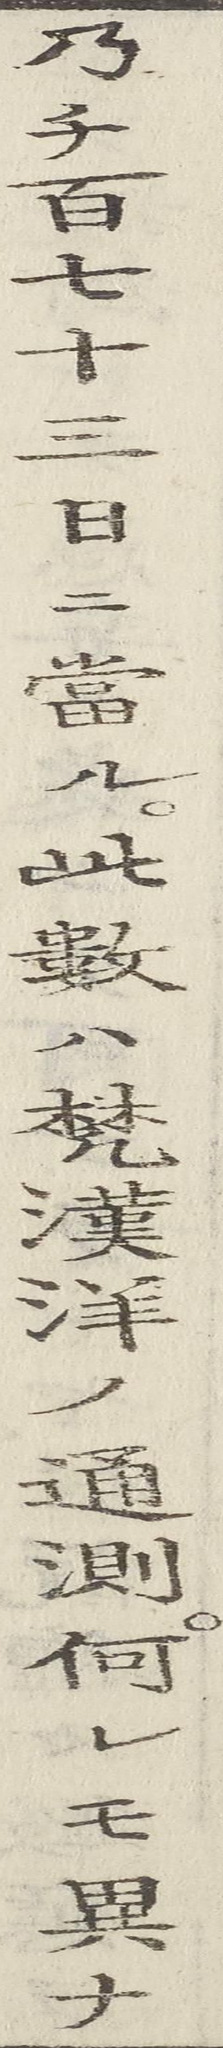乃チ百七十三日ニ当ル。此数ハ梵漢洋ノ通測。何レモ異ナ
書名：護法新論　二編　下
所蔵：東京大学地震研究所図書室 Earthquake Research Institute Library, The University of Tokyo, JAPAN
